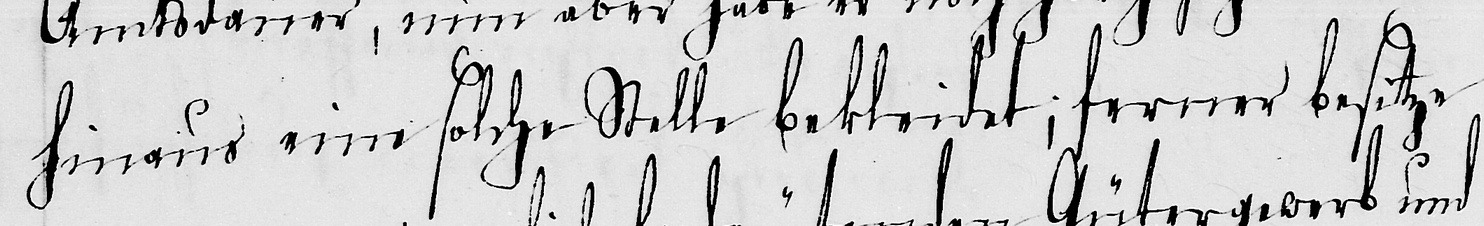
hinaus eine solche Stelle bekleidet; ferner besitze
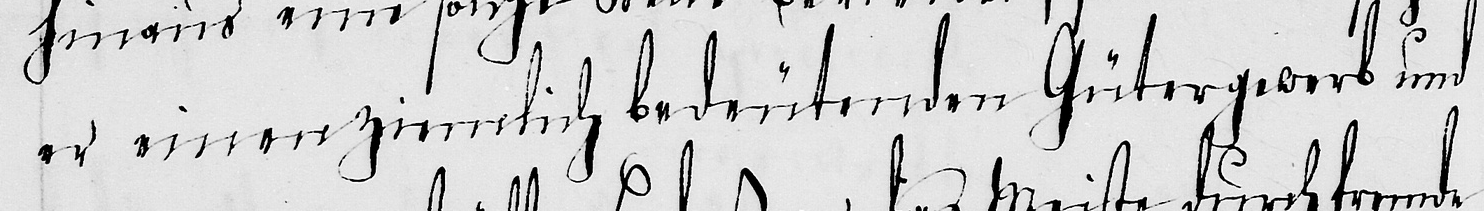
er einen ziemlich bedeutenden Gütergewerb und
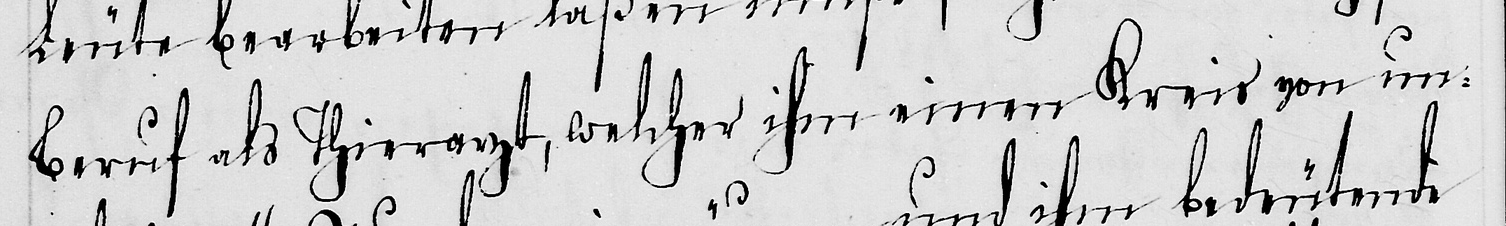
Beruf als Thierarzt, welcher ihm einen Kreis von un¬
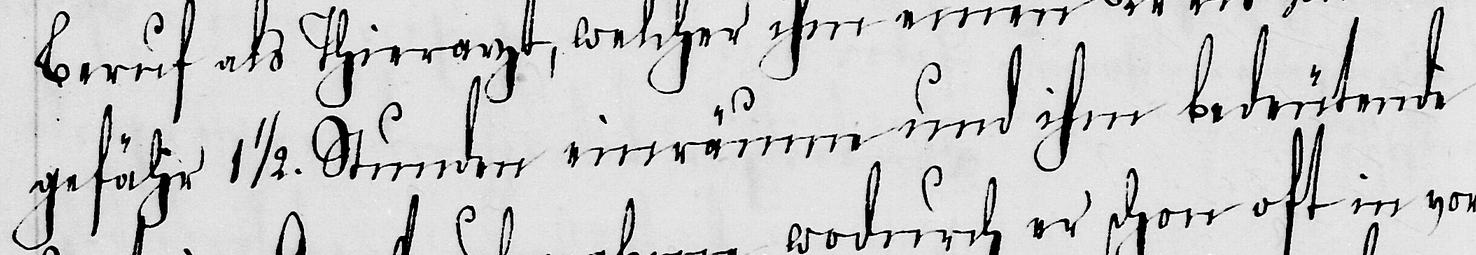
gefähr 11/2. Stunden einräume und ihm bedeutende
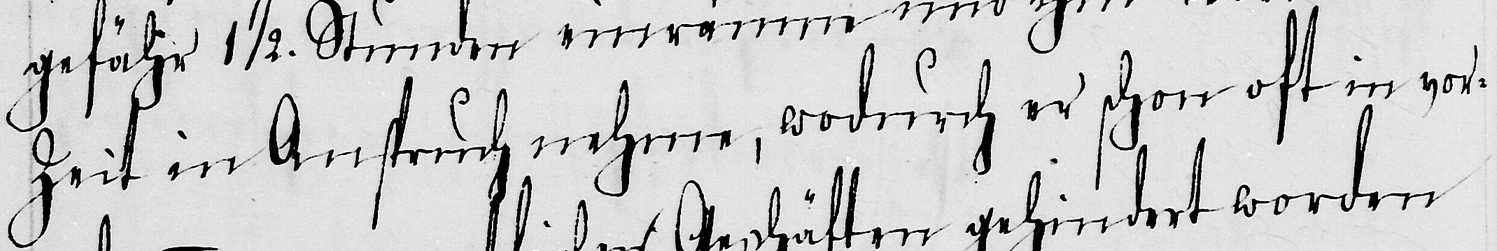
Zeit in Anspruch nehme, wodurch er schon oft in vor¬
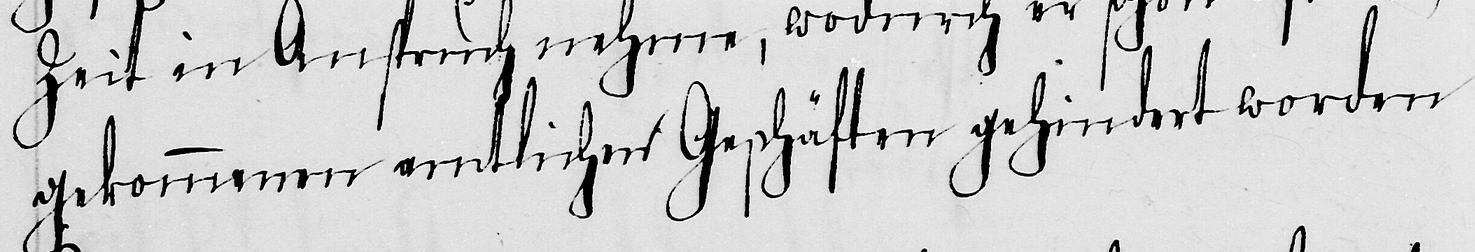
gekommenen amtlichen Geschäften gehindert worden
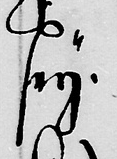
sey.
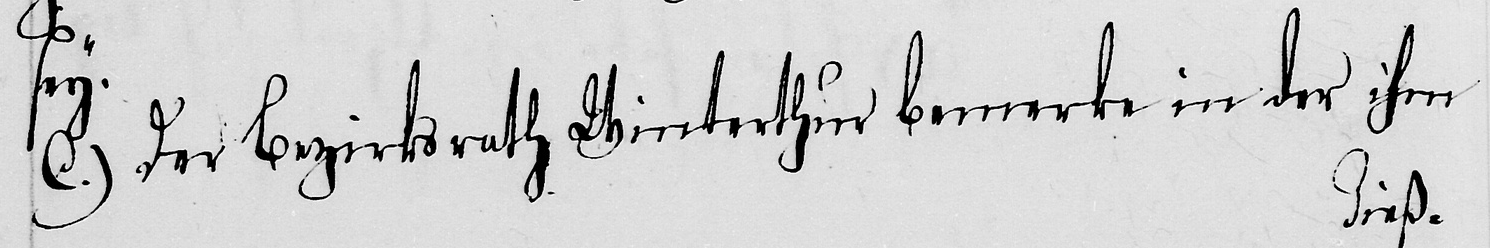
C.) Der Bezirksrath Winterthur bemerke in der ihm
